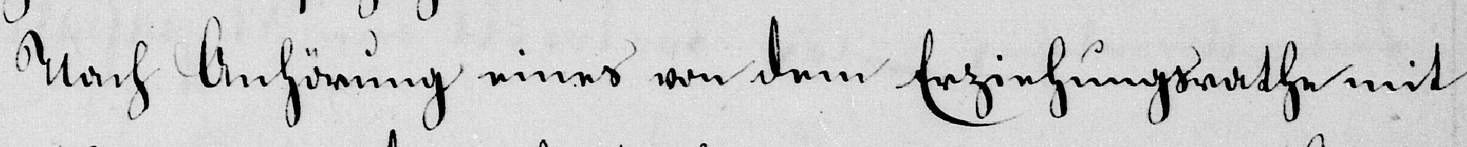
Nach Anhörung eines von dem Erziehungsrathe mit
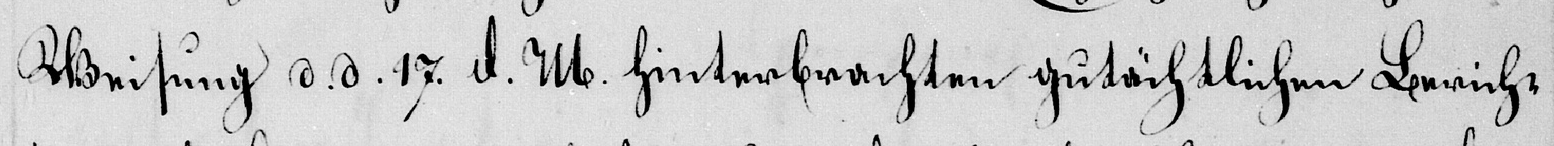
Weisung d. d. 17. d. M. hinterbrachten gutächtlichen Berich¬
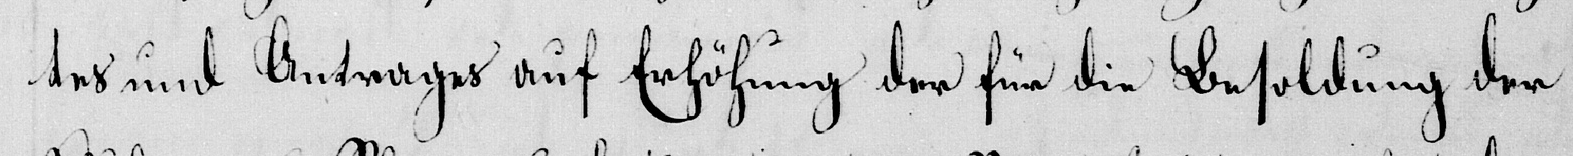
tes und Antrages auf Erhöhung der für die Besoldung der
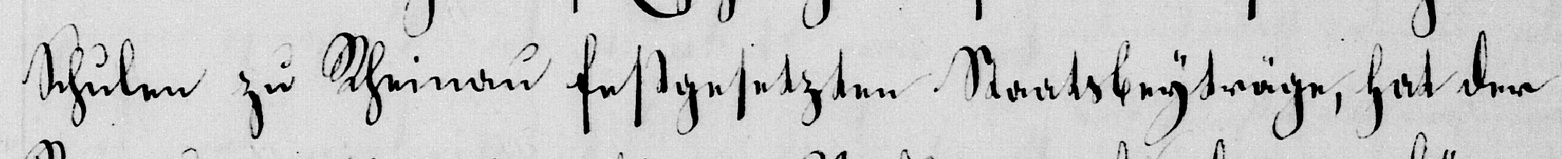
Schulen zu Rheinau festgesetzten Staatsbeyträge, hat der
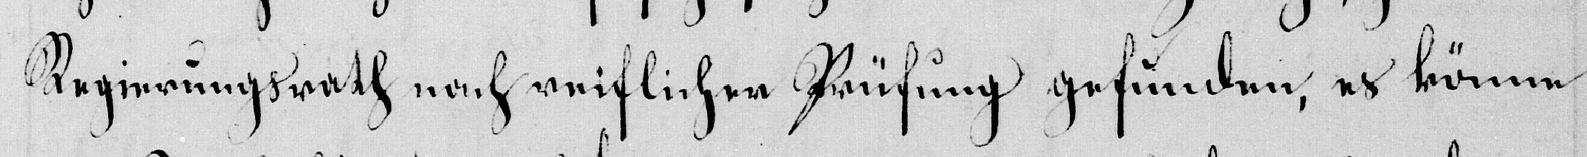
Regierungsrath nach reiflicher Prüfung gefunden, es könne
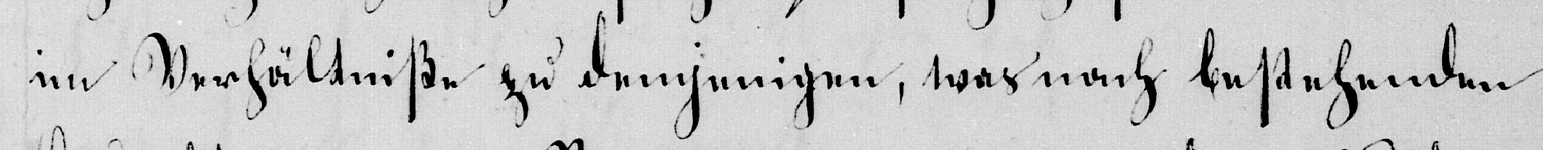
im Verhältniße zu demjenigen, was nach bestehenden
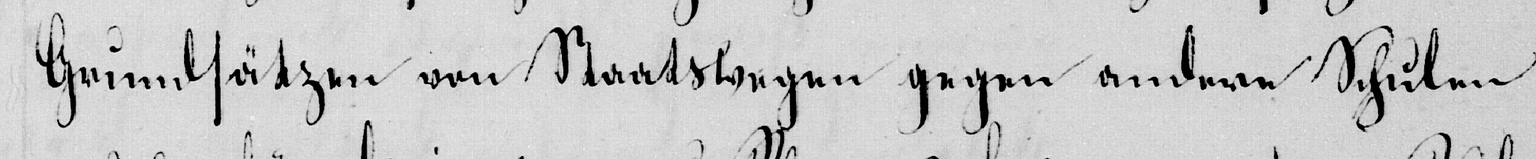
Grundsätzen von Staatswegen gegen andere Schulen
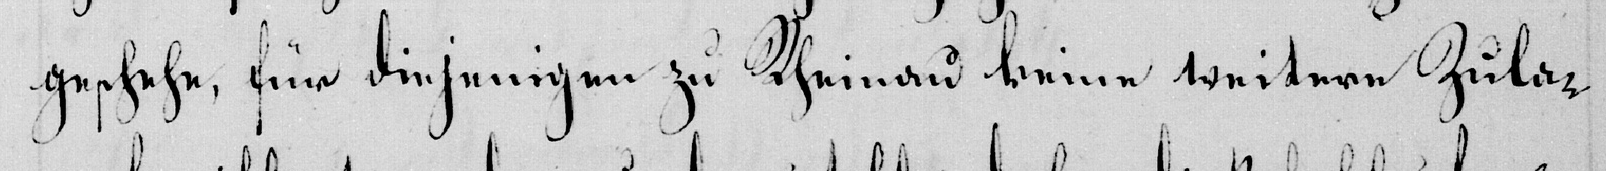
geschehe, für diejenigen zu Rheinau keine weitere Zula¬
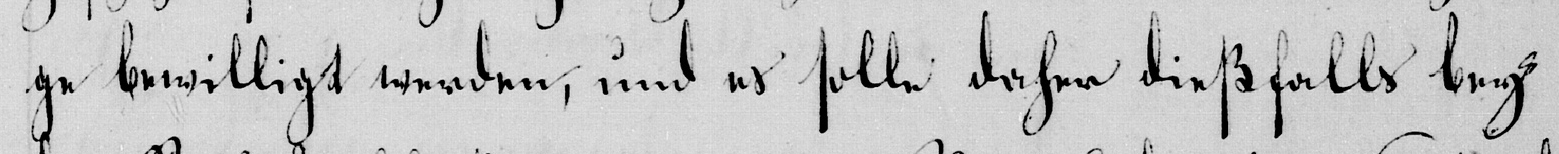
ge bewilligt werden, und es solle daher dießfalls bey
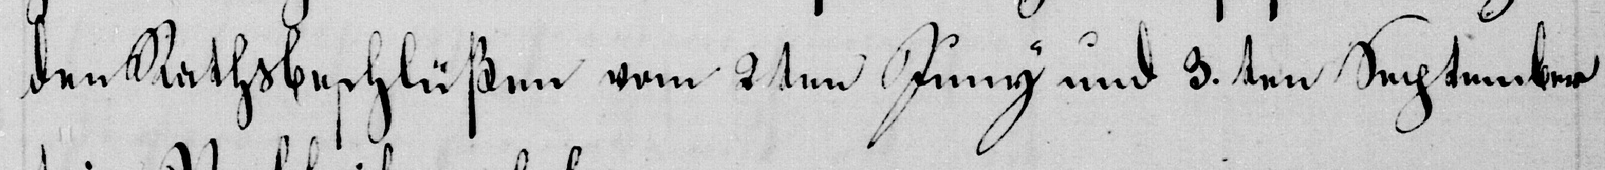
den Rathsbeschlüßen vom 2ten Juny und 3.ten September
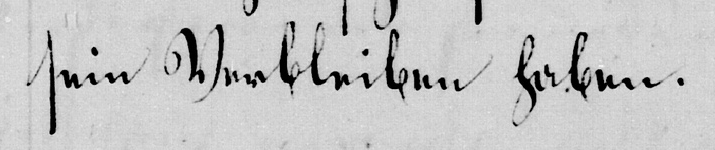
sein Verbleiben haben.
